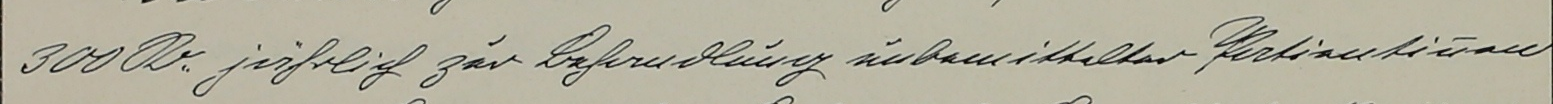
300 Ro. jährlich zur Behandlung unbemittelter Patientinnen
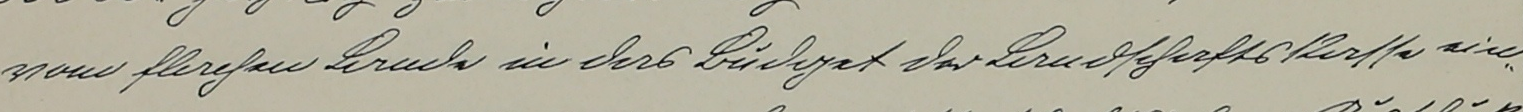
vom flachen Lande in das Budget der Landschaftskasse ein-
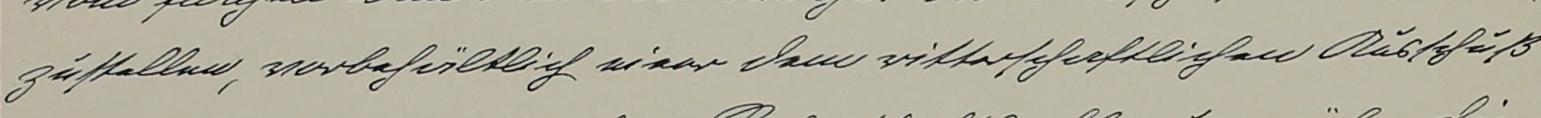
zustellen, vorbehältlich einer dem ritterschaftlichen Ausschuß
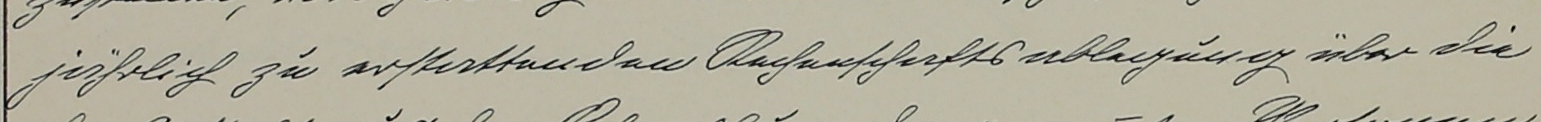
jährlich zu erstattenden Rechenschaftsablegung über die
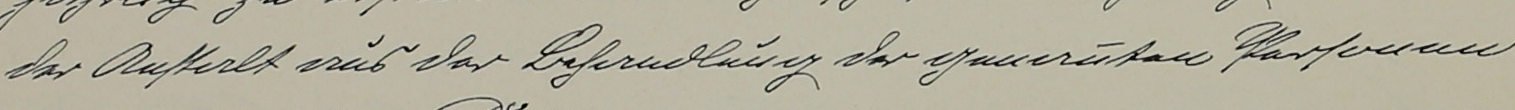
der Anstalt aus der Behandlung der genannten Personen
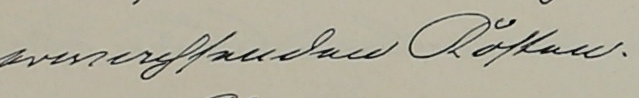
erwachsendenen Kosten.
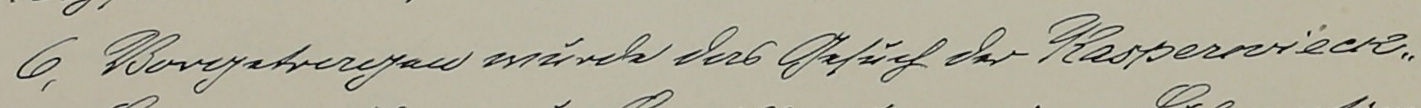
6. Vorgetragen wurde das Gesuch der Kasperwieck-
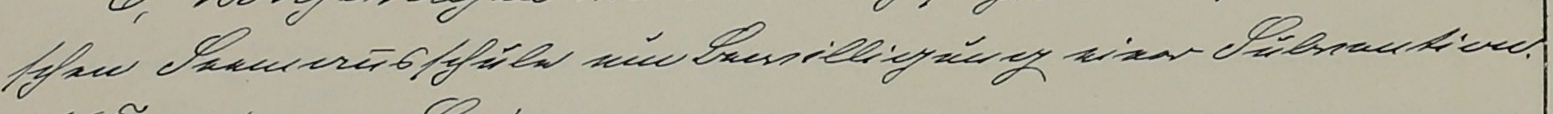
schen Seemannsschule um Bewilligung einer Subvention.
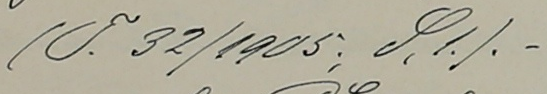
(T.32/1905; S.1).
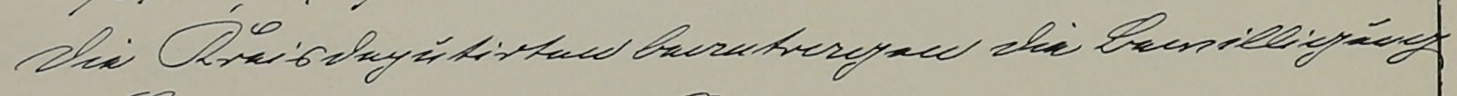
Die Kreisdeputirten beantragen die Bewilligung
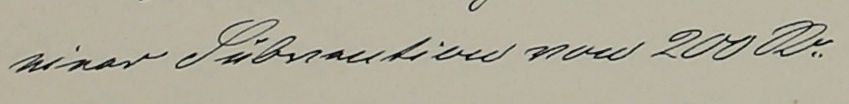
einer Subvention von 200 Ro.
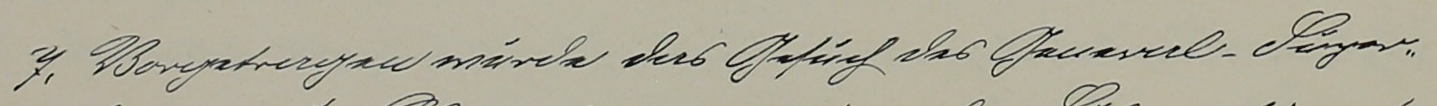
7. Vorgetragen wurde das Gesuch des General-Super-
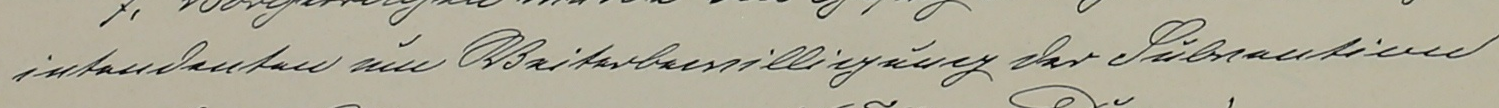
intendenten um Weiterbewilligung der Subvention
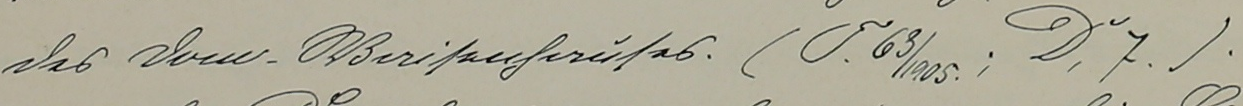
des Dom-Waisenhauses. (T.63/1905; D.7).
